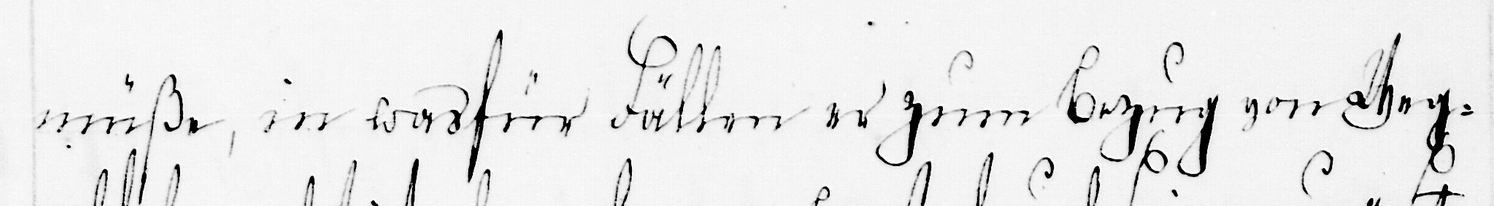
müße, in was für Fällen er zum Bezug von Weg¬
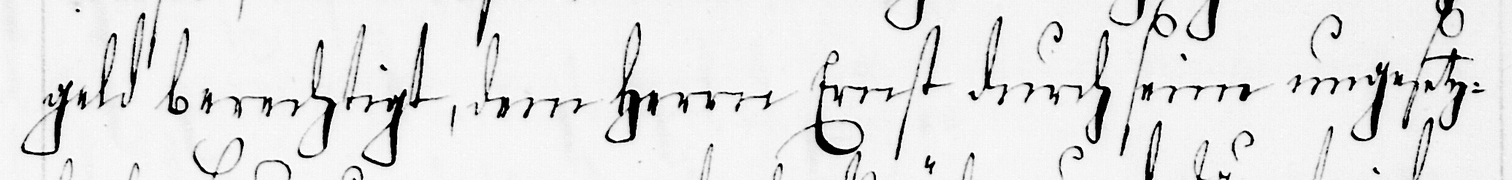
geld berechtigt, dem Herrn Ernst durch seine ungesetz¬
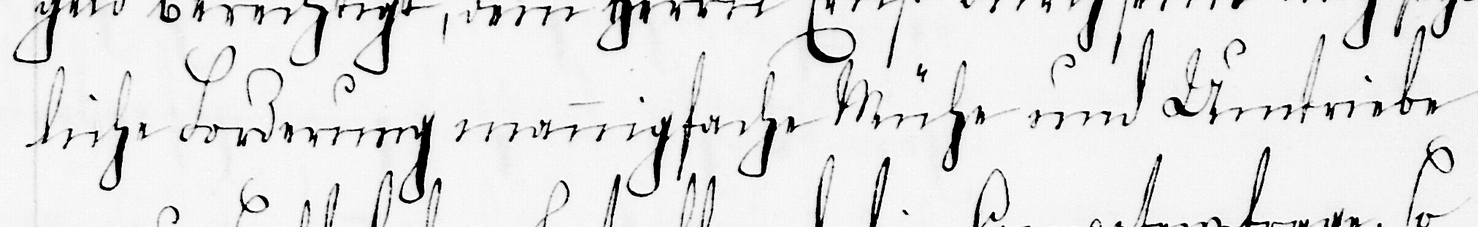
liche Forderung mannigfache Mühe und Umtriebe
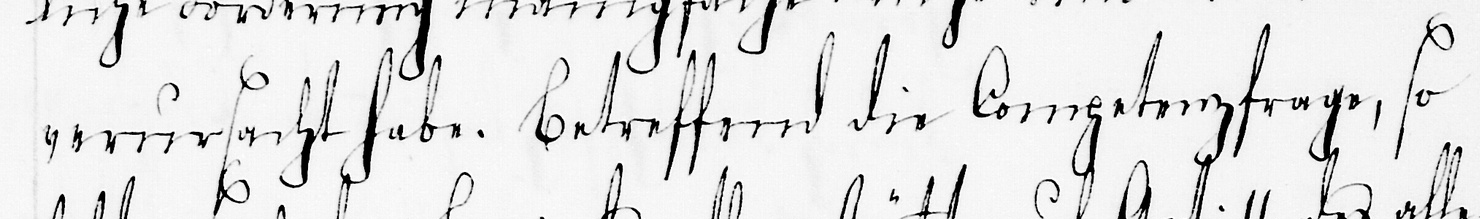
verursacht habe. Betreffend die Competenzfrage, so
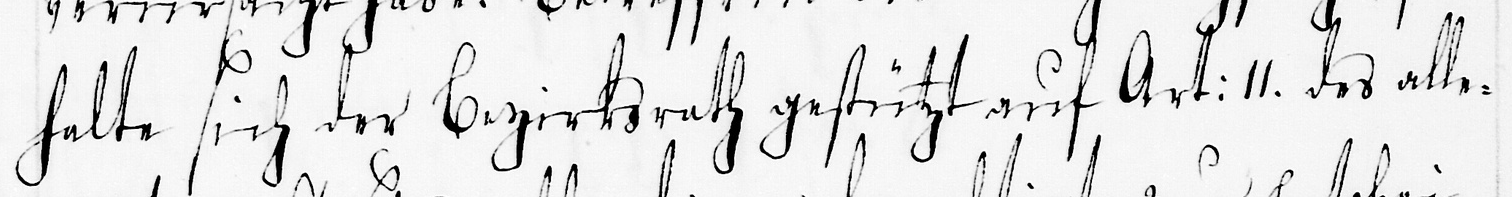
halte sich der Bezirksrath gestützt auf Art: 11. des alle¬
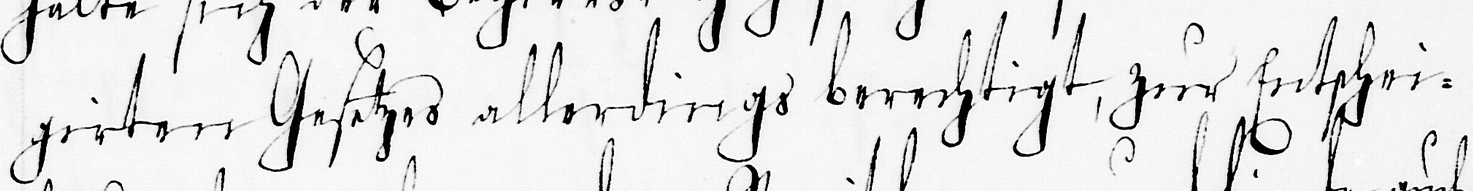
girten Gesetzes allerdings berechtigt, zur Entschei¬
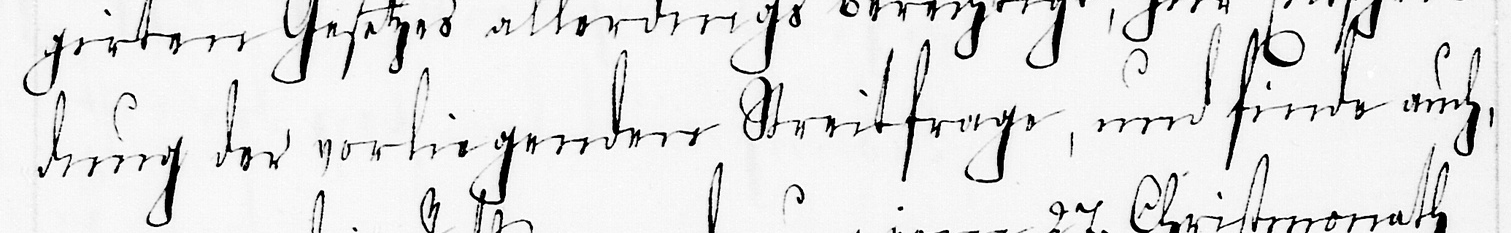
dung der vorliegenden Streitfrage, und finde auch,
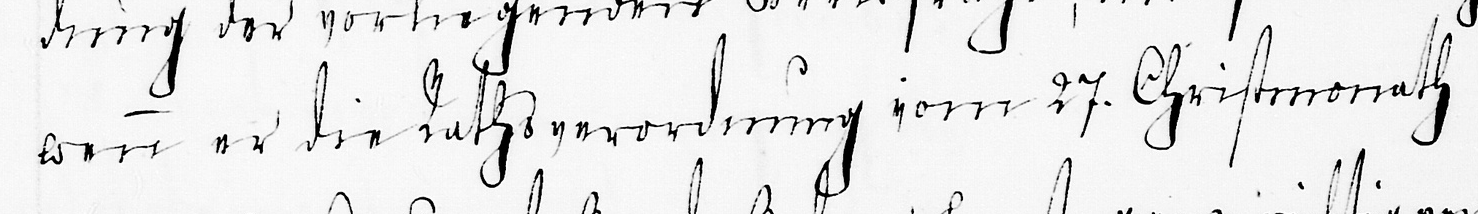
wenn er die Rathsverordnung vom 27. Christmonath
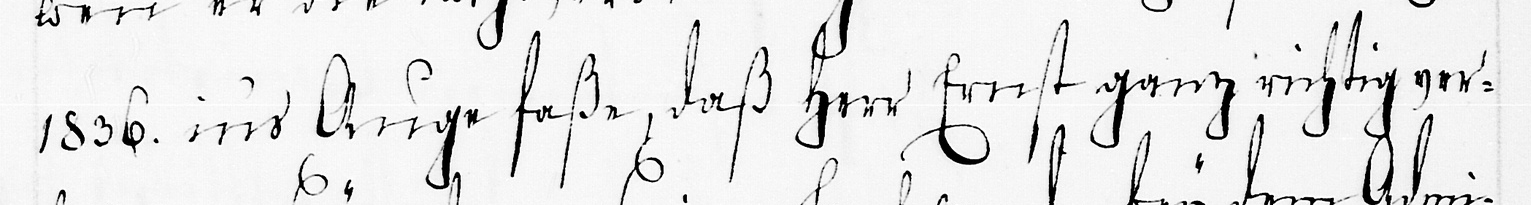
1836. ins Auge faße, daß Herr Ernst ganz richtig ver¬
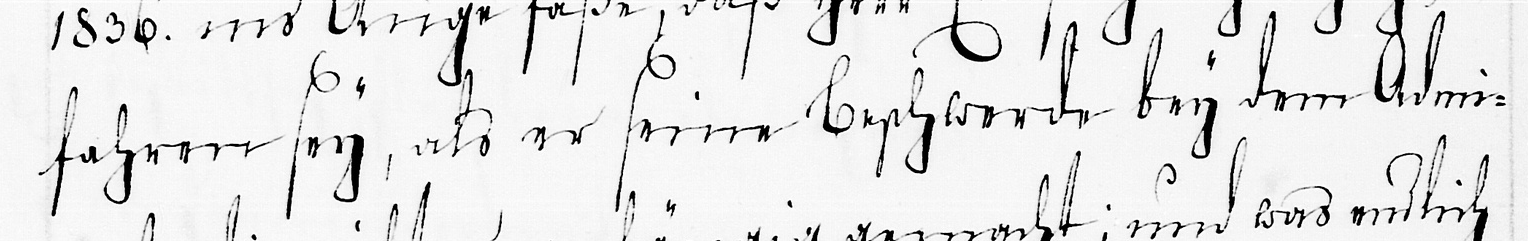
fahren sey, als er seine Beschwerde bey dem Admi¬
